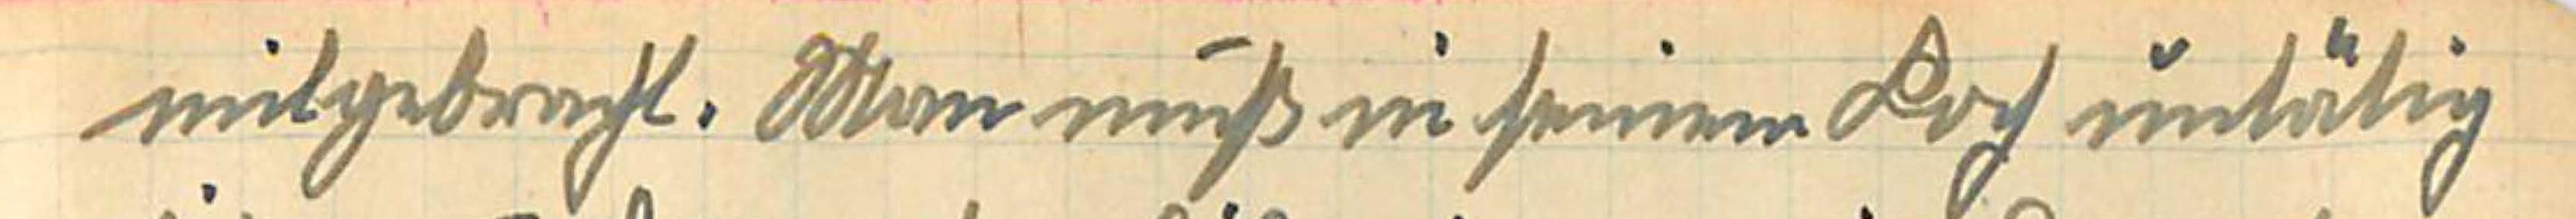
mitgebracht. Man muß in seinem Loch untätig
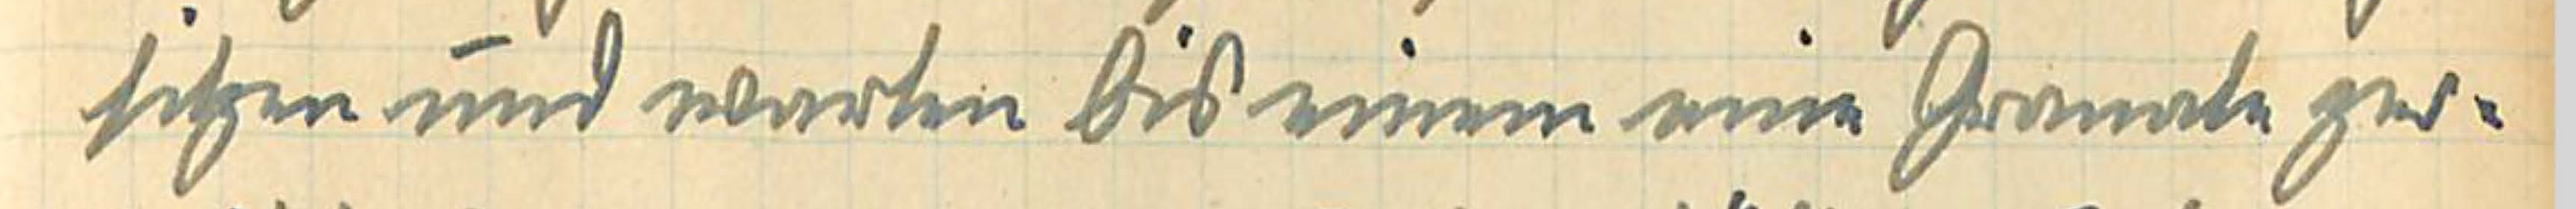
sitzen und warten bis einem eine Granate zer-
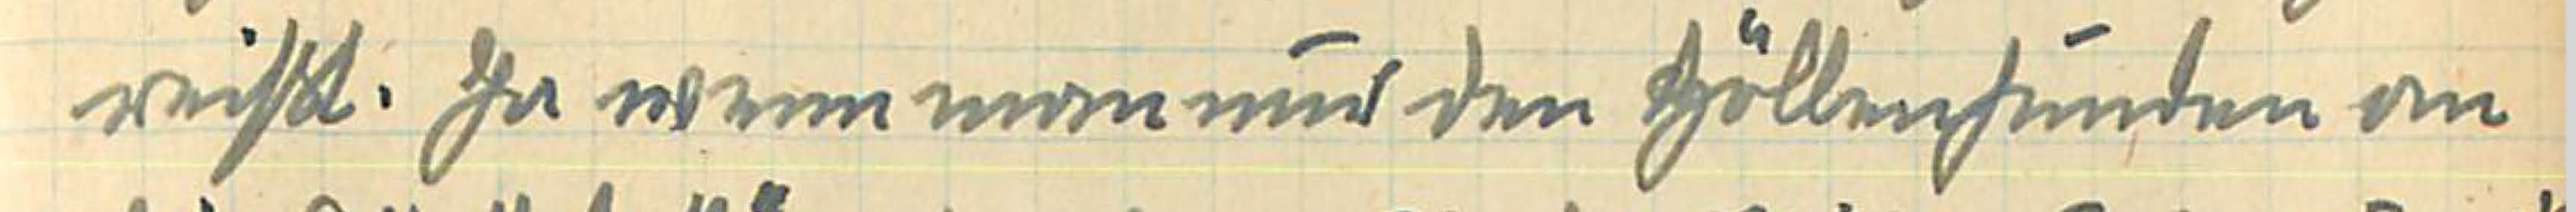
reißt. Ja wenn man nur den Höllenhunden an
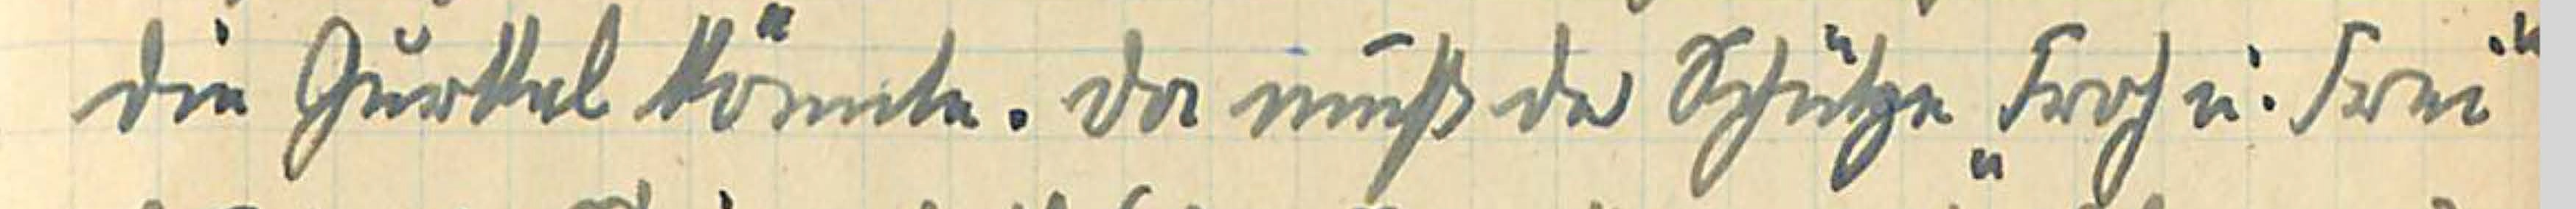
die Gurkel könnte. Da muß der Schütze „Froh u. Frei”
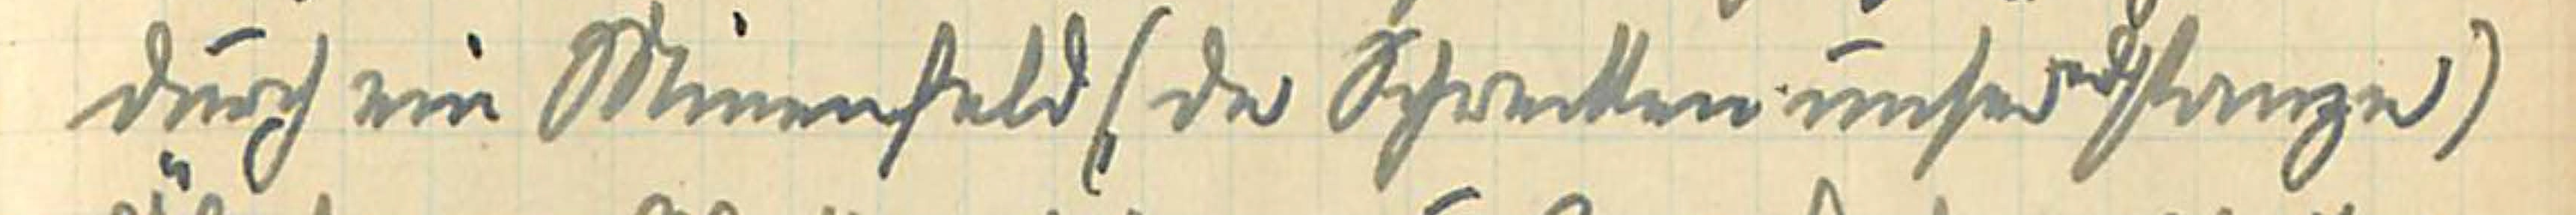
durch ein Minenfeld, (der Schrecken unserer Panzer)
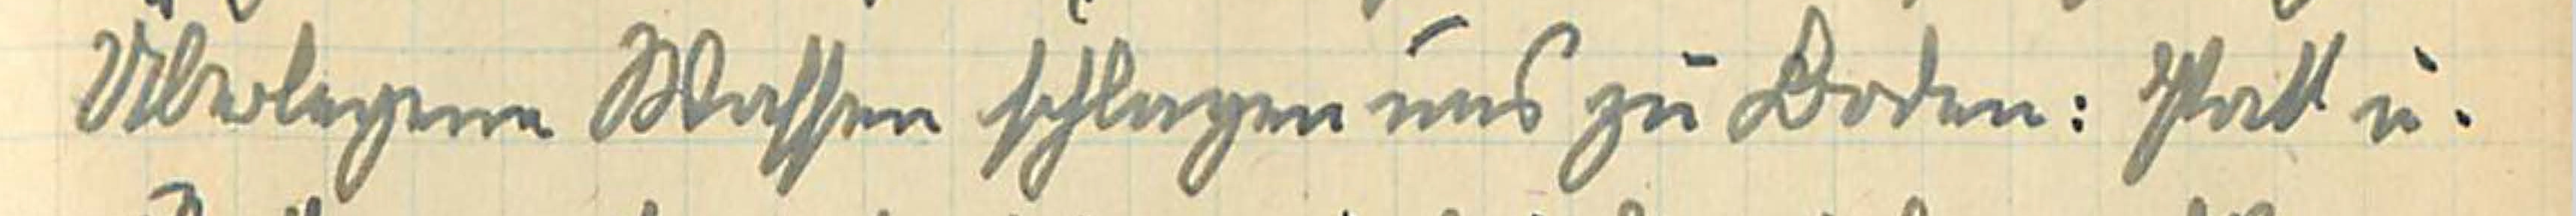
Überlegene Waffen schlagen uns zu Boden: Pak u.
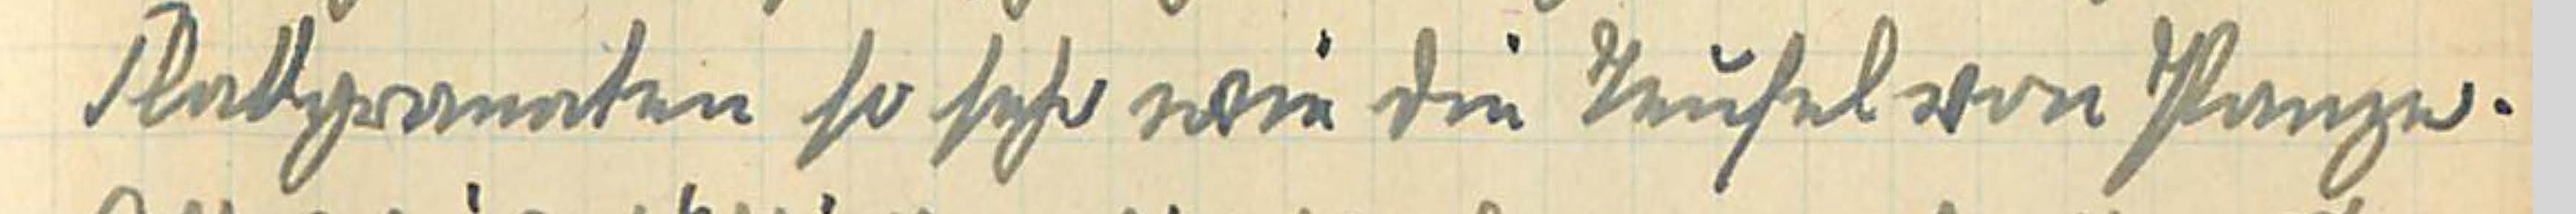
Flakgranaten so sehr wie die Teufel von Panzer.
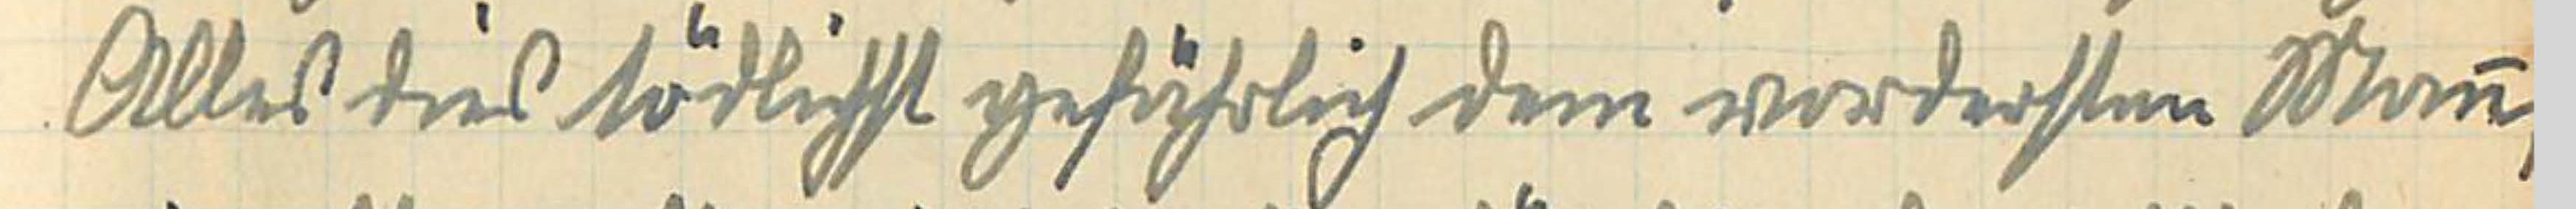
Alles dies tödlichst gefährlich dem vordersten Mann,
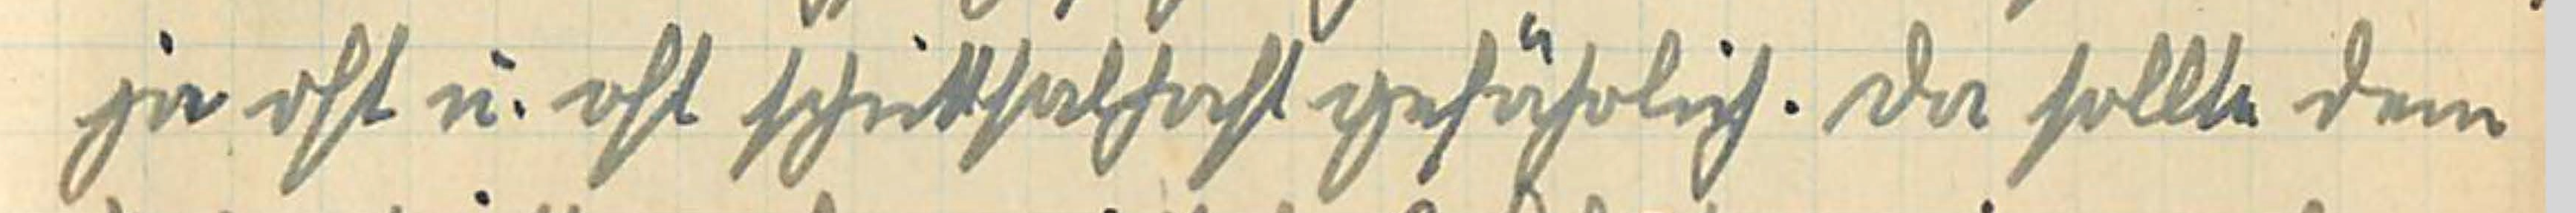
ja oft u. oft schicksalhaft gefährlich. Da sollte dem
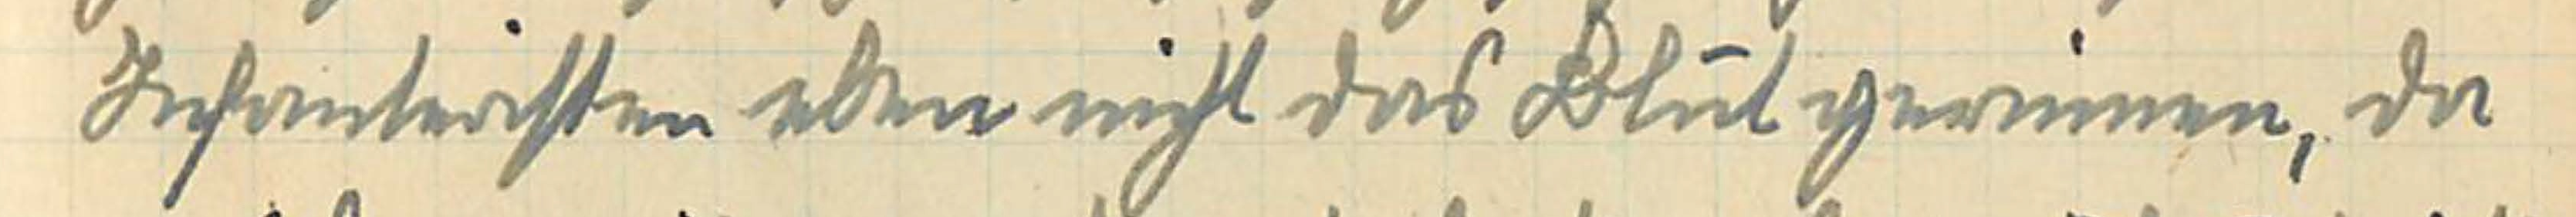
Infanteristen eben nicht das Blut gerinnen, da
